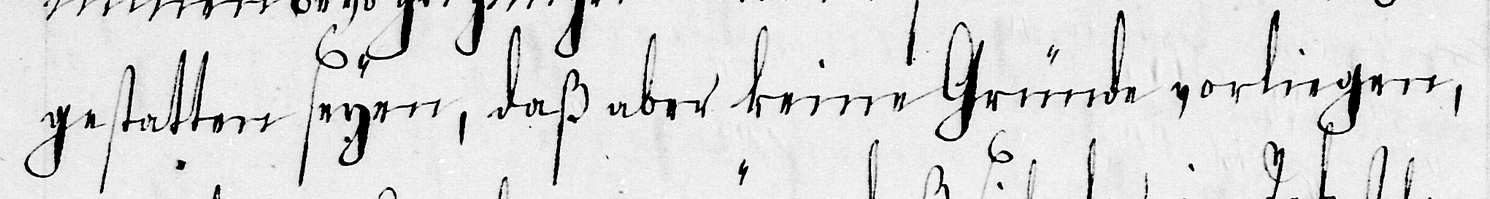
gestatten seyen, daß aber keine Gründe vorliegen,
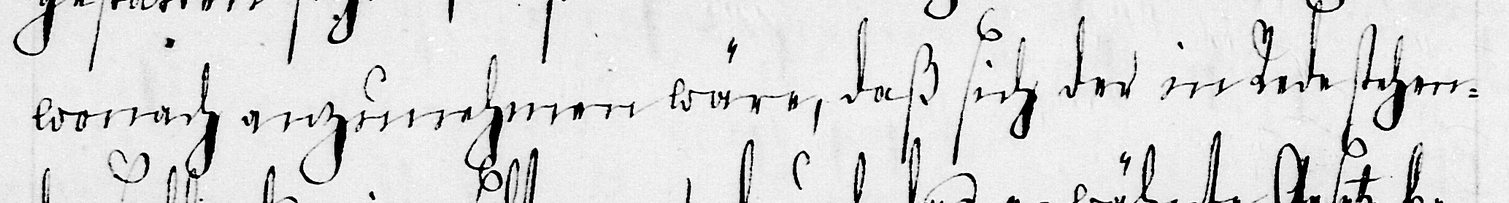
wonach anzunehmen wäre, daß sich der in Rede stehen¬
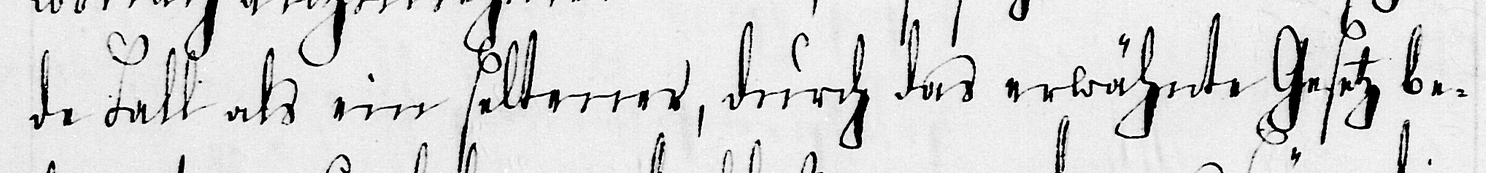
de Fall als ein seltener, durch das erwähnte Gesetz be¬
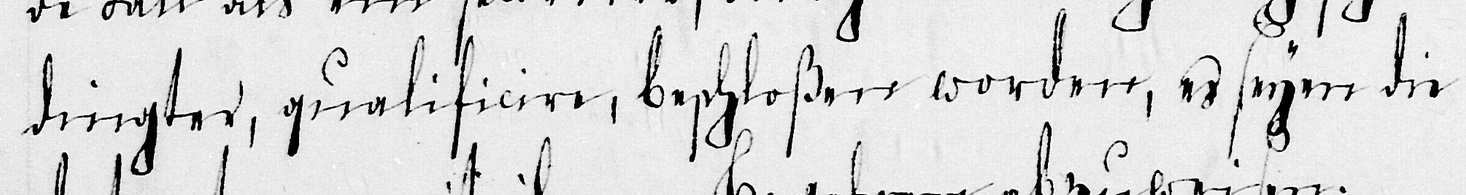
dingter, qualificire, beschloßen worden, es seyen die
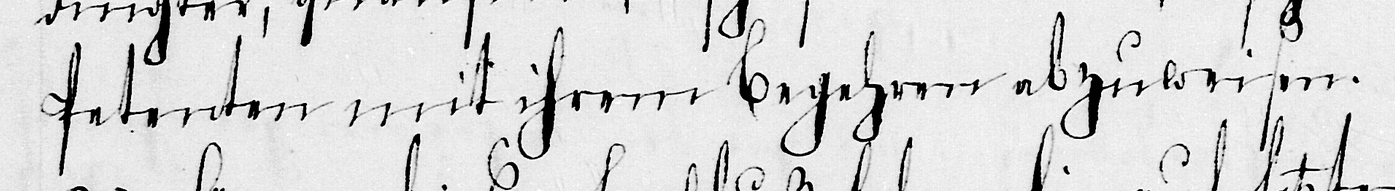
Petenten mit ihrem Begehren abzuweisen.
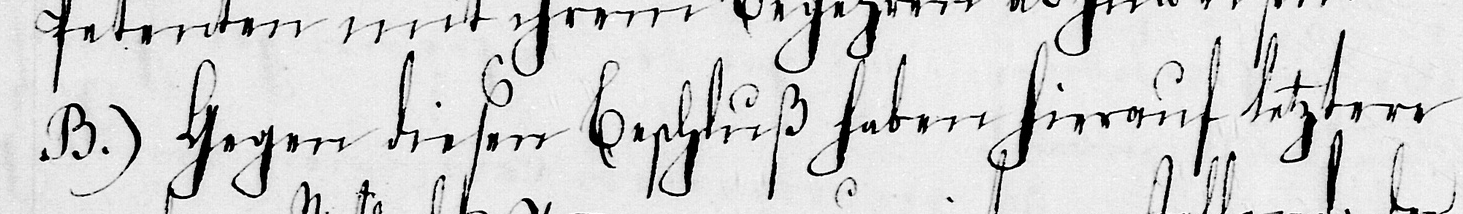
B.) Gegen diesen Beschluß haben hierauf letztere
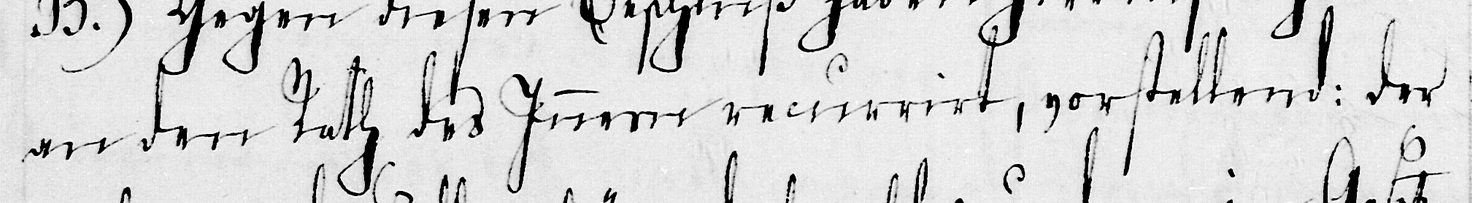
an den Rath des Innern recurrirt, vorstellend: der
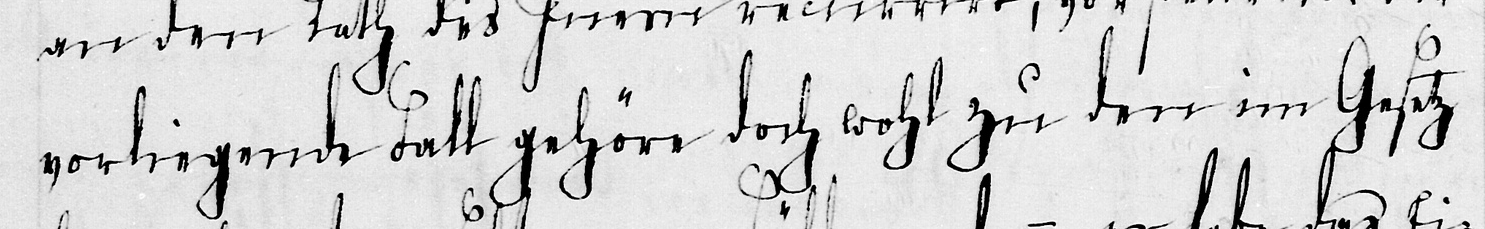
vorliegende Fall gehöre doch wohl zu den im Gesetz
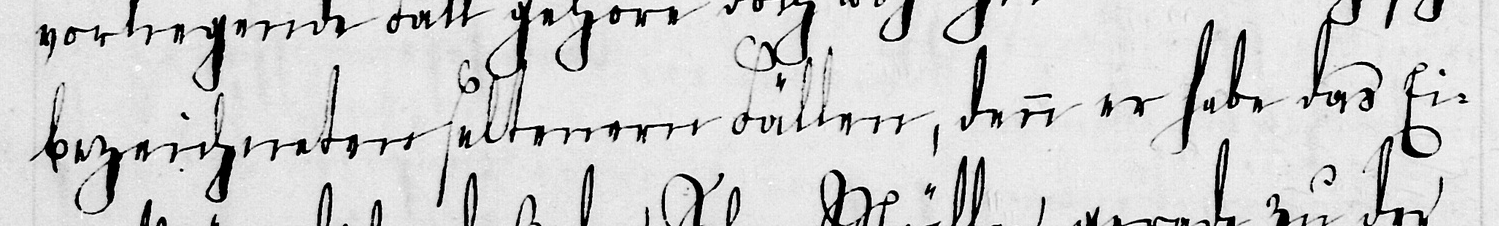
bezeichneten seltenen Fällen, denn er habe das Ei¬
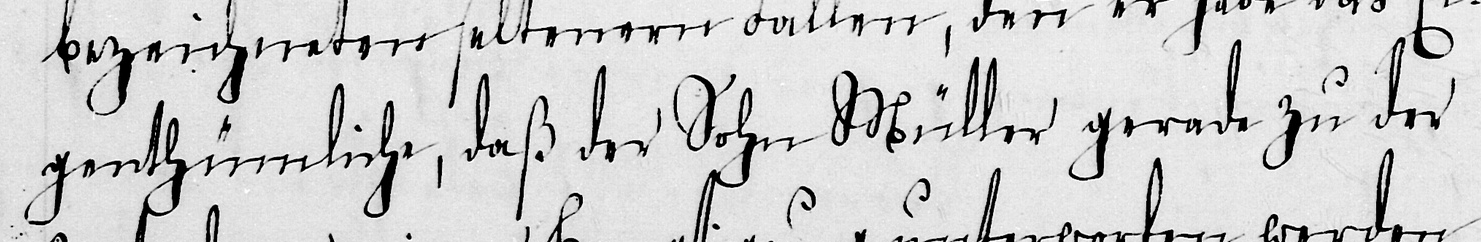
genthümliche, daß der Sohn Müller gerade zu der
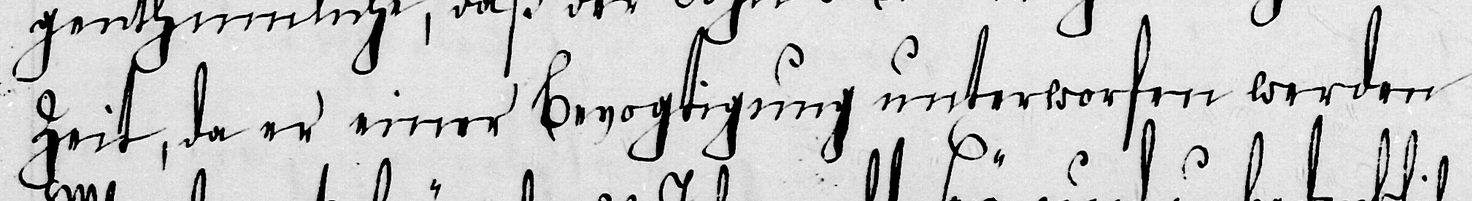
Zeit, da er einer Bevogtigung unterworfen werden
